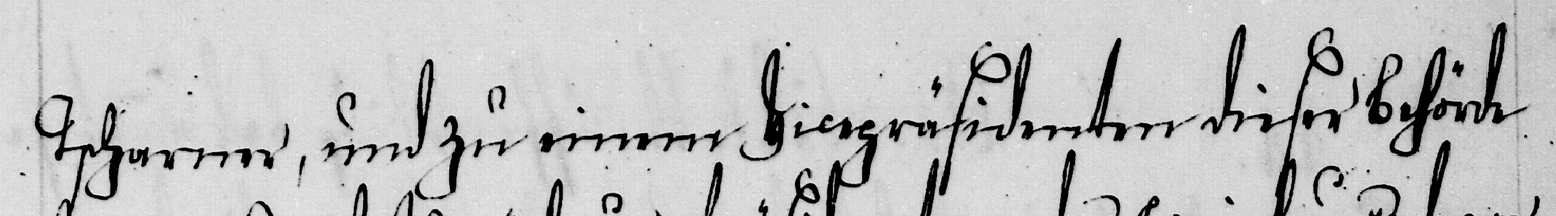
Tscharner, und zu einem Vicepräsidenten dieser Behörde
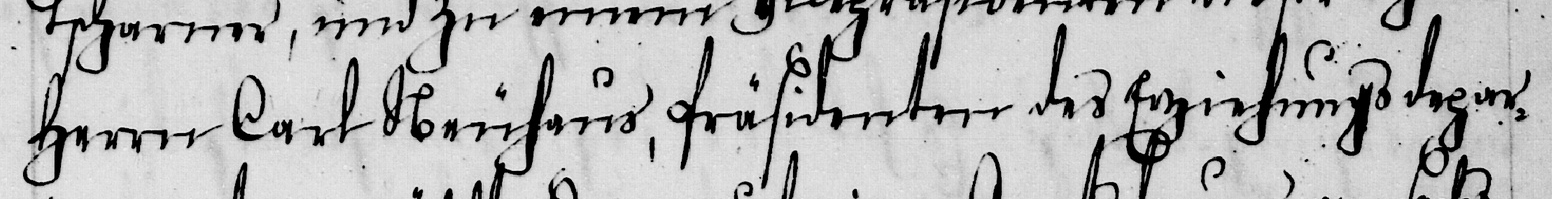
Herrn Carl Neuhaus, Präsidenten des Erziehungsdepar¬
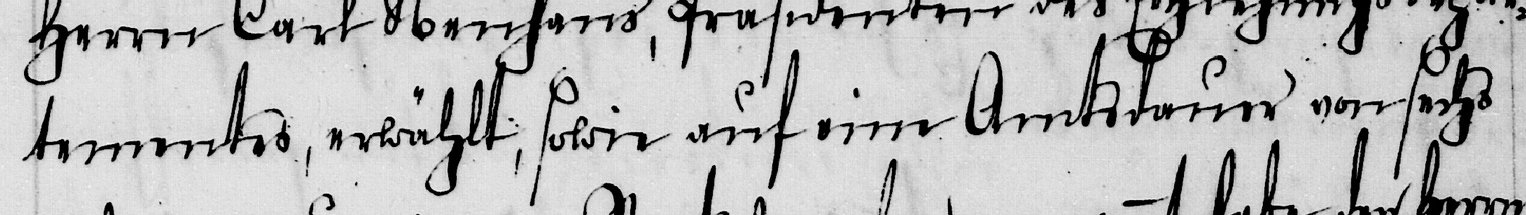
tementes, erwählt, sowie auf eine Amtsdauer von sechs
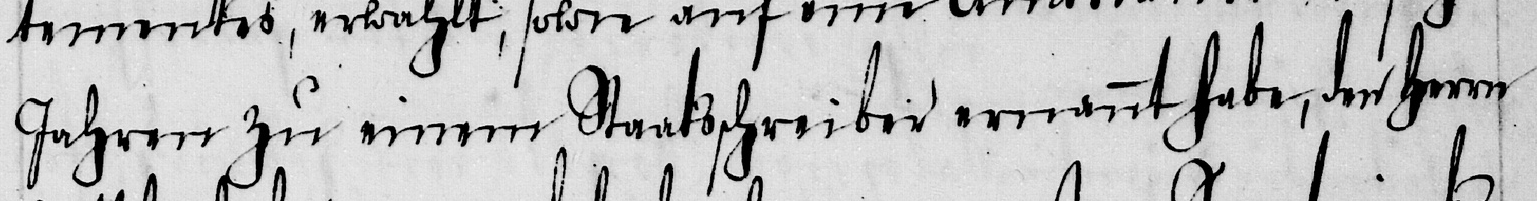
Jahren zu einem Staatsschreiber ernannt habe, den Herrn
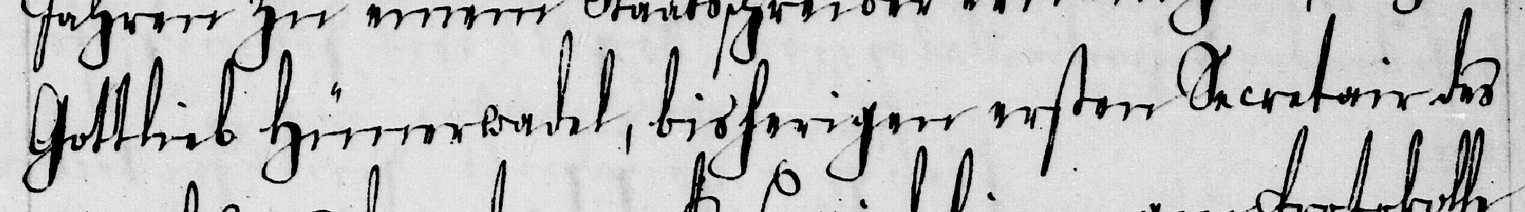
Gottlieb Hünerwadel, bisherigen ersten Secretair des
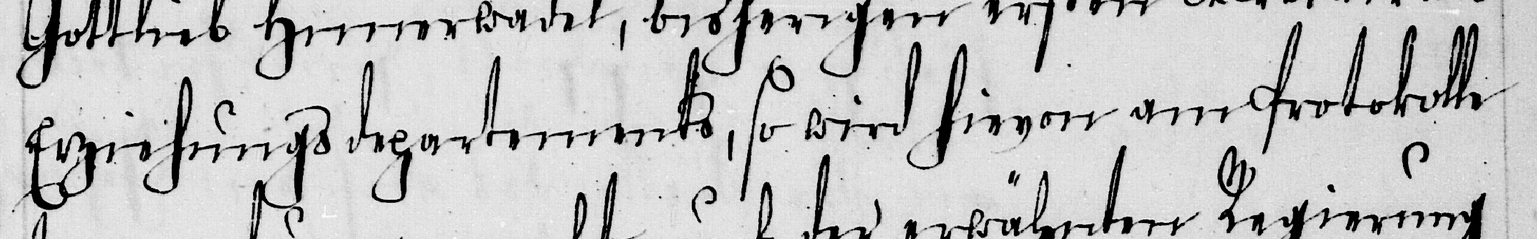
Erziehungsdepartements, so wird hievon am Protokolle
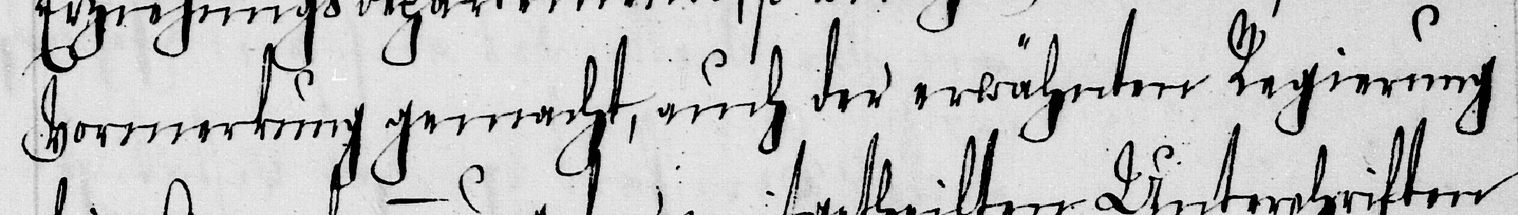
Vormerkung gemacht, auch der erwähnten Regierung
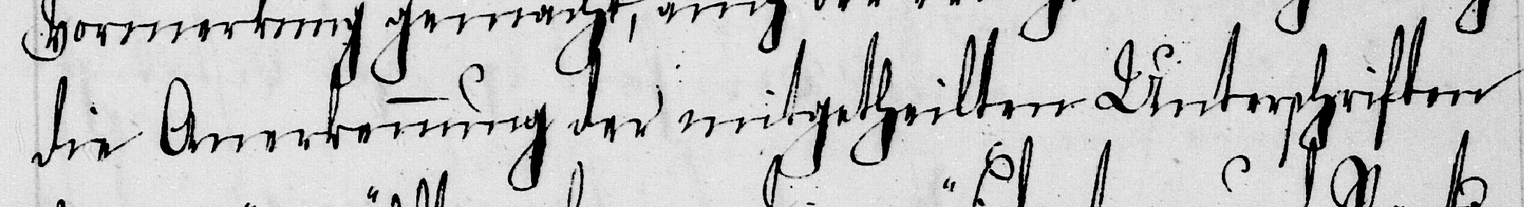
die Anmerkung der mitgetheilten Unterschriften
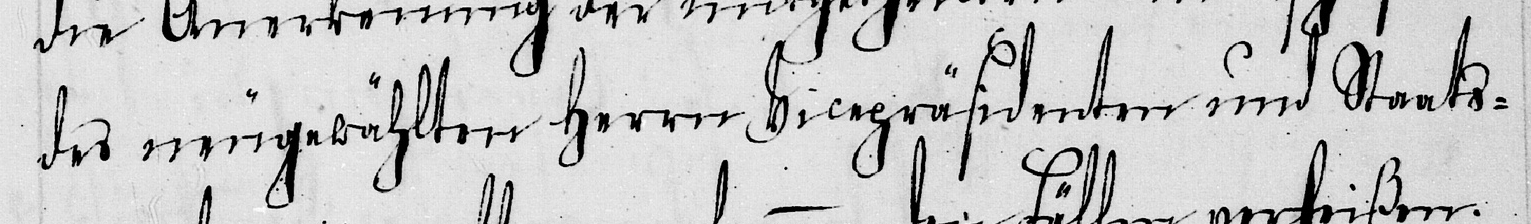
des neugewählten Herrn Vicepräsidenten und Staats¬
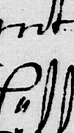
d.
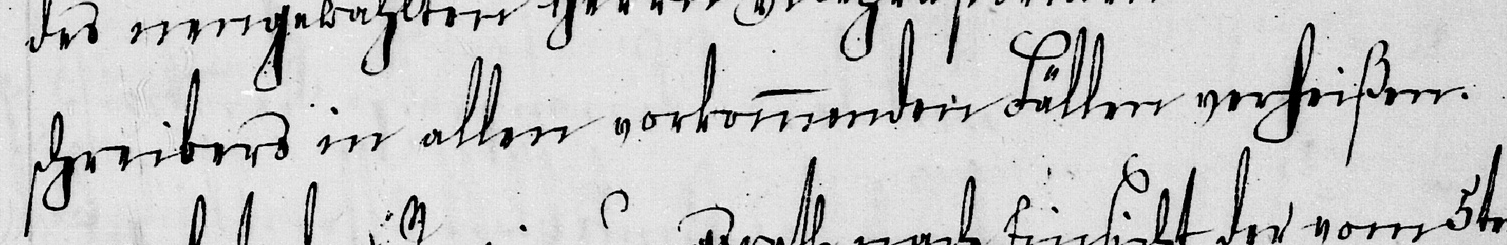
schreibers in allen vorkommenden Fällen verheißen.
